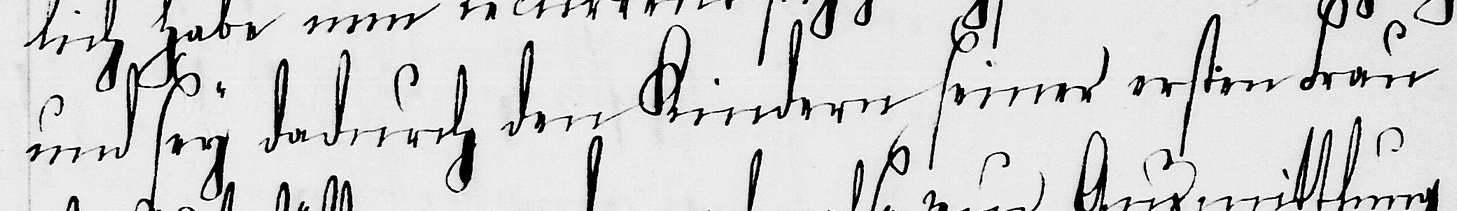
und sey dadurch den Kindern seiner ersten Frau
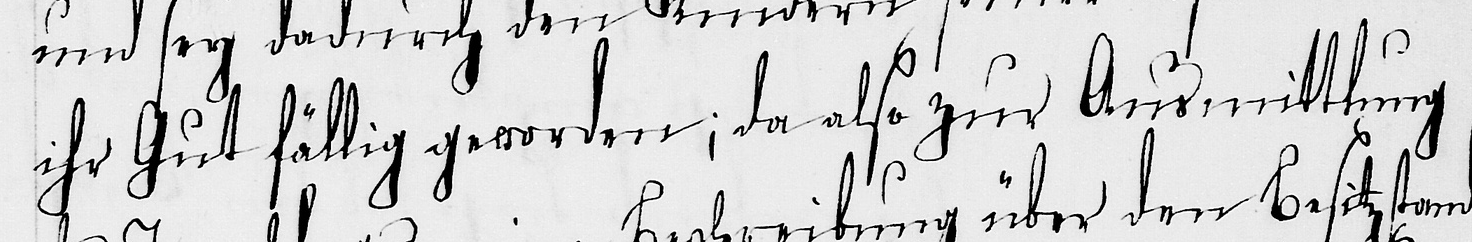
ihr Gut fällig geworden; da also zur Ausmittelung
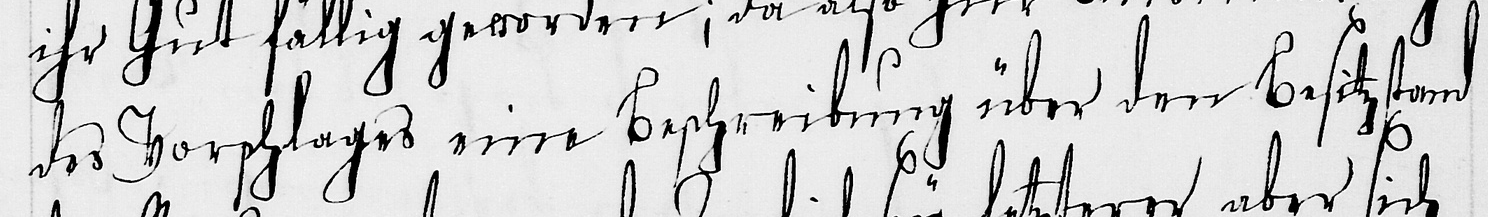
des Vorschlages eine Beschreibung über den Besitzstand
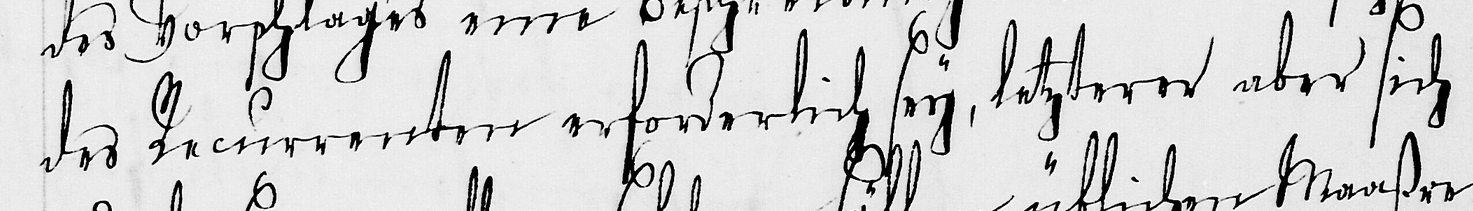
des Recurrenten erforderlich sey, letzterer aber sich
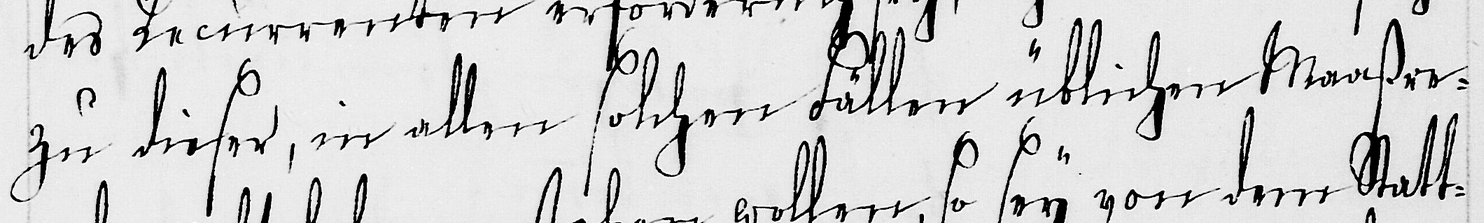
zu dieser, in allen solchen Fällen üblichen Maaßre¬
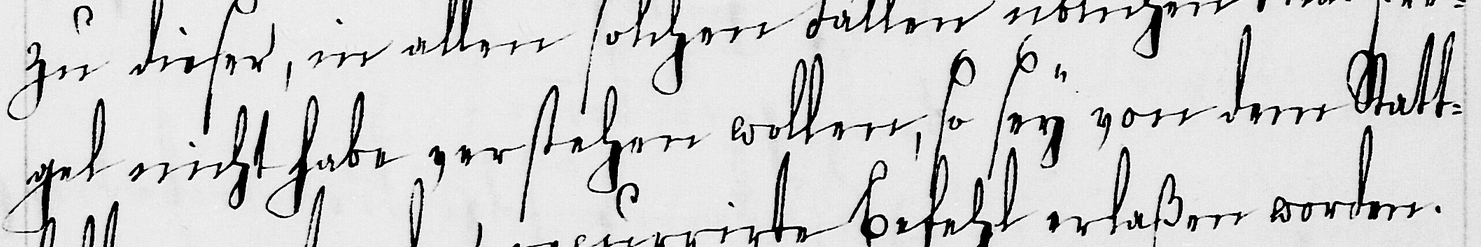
gel nicht habe verstehen wollen, so sey von dem Statt¬
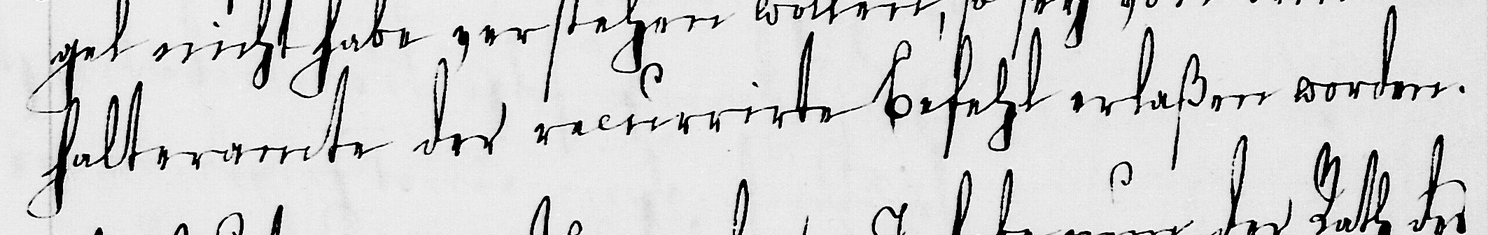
halteramte der recurrirte Befehl erlaßen worden.
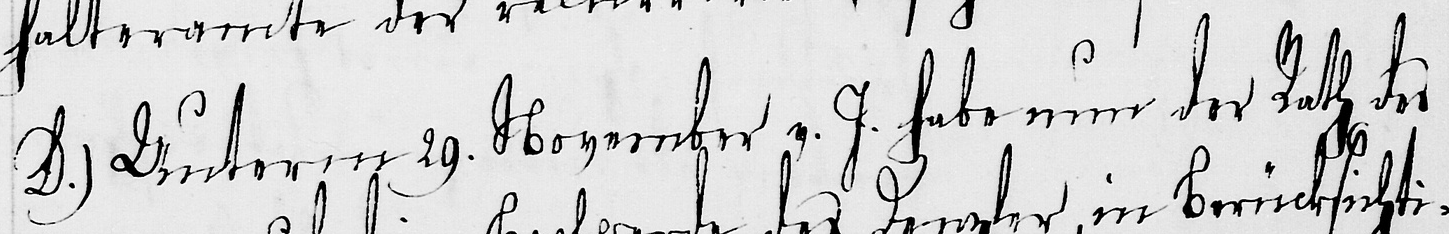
D.) Unterm 29. November v. J. habe nun der Rath des
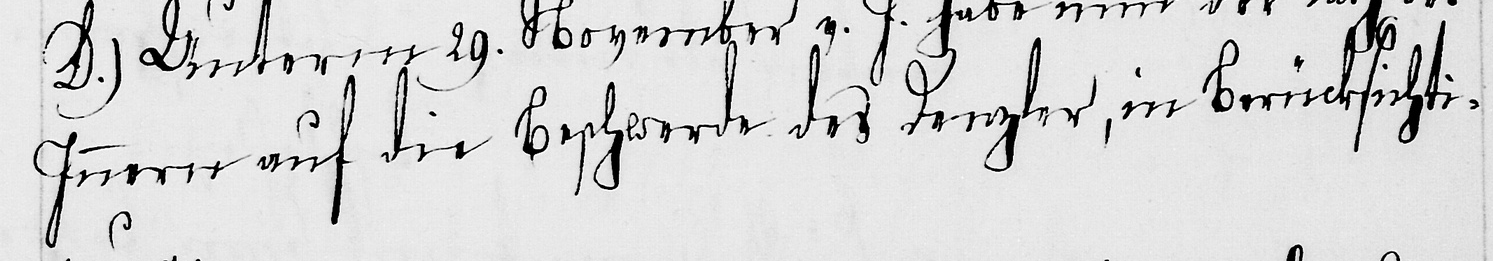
Innern auf die Beschwerde des Denzler, in Berücksichti¬
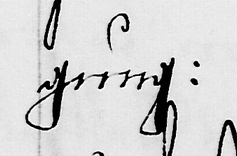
gung:
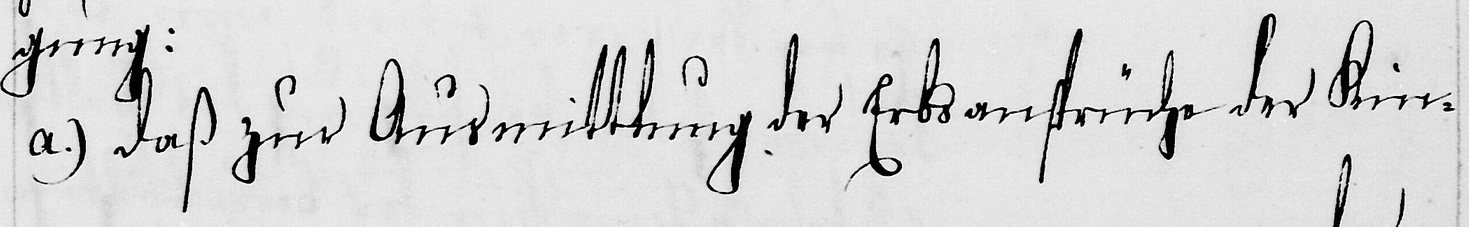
a.) Daß zur Ausmittlung der Erbsansprüche der Kin-
